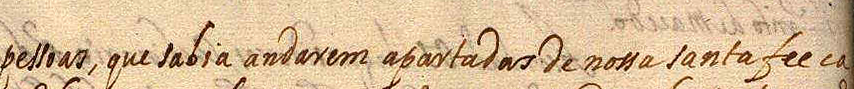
pessoas, que sabia andarem apartadas de nossa santa fee ca
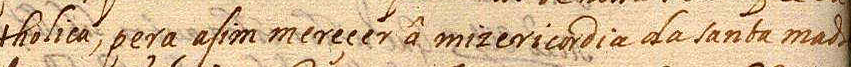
tholica, pera asim merecer â mizericordia da santa madr
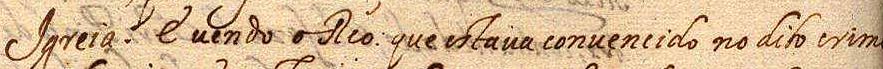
Igreia. e uendo o Reo: que estaua conuencido no dito crim
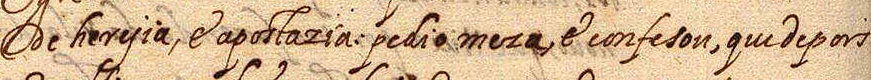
de herejia, e apostazia: pedio meza, e confesou, que depois
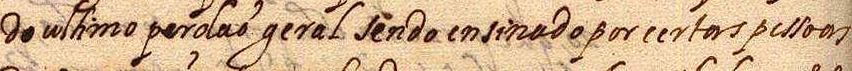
do ultimo perdão geral sendo ensinado por certas pessoas
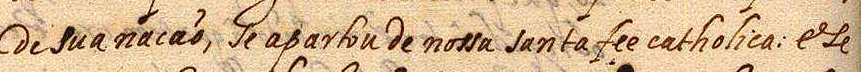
de sua naçaõ, se apartou de nossa santa fee catholica: e se
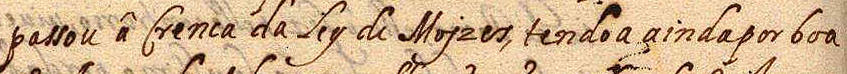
passou â Crença da Ley de Mojzes, tendo a ainda por boa
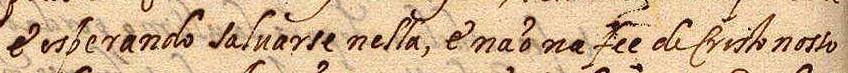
e esperando saluarse nella, e naõ na fee de Cristo nosso
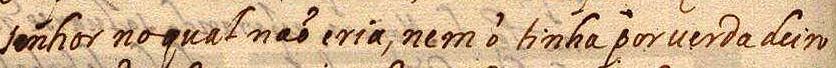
senhor no qual naõ cria, nem ó tinha por uerdadeiro
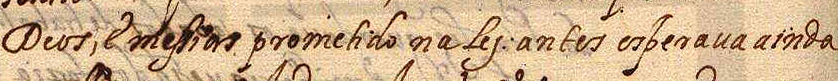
Deos, e messias prometido na Lej antes esperaua ainda
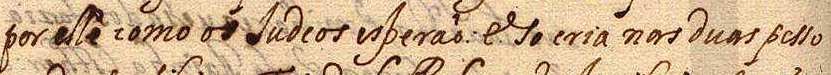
por elle como os Iudeos esperaõ: e so cria nas duas pesso
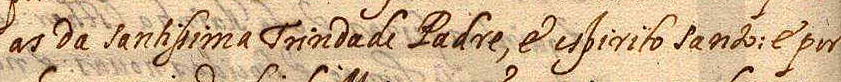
as da santissima Trindade Padre, e espirito santo: e por
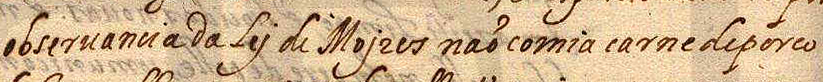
obseruancia da Lej de Mojzes naõ comia carne de porco
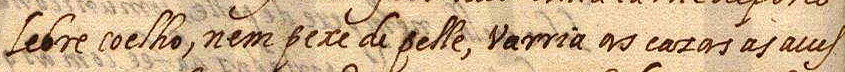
Lebre coelho, nem pexe de pelle, varria as cazas as aues
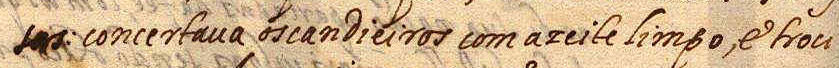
sas concertaua os candieiros com azeite limpo, e troci
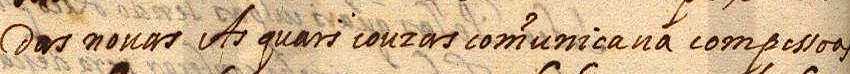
das nouas As quais couzas com̄unicaua com pessoas
